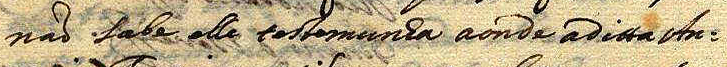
naõ sabe elle testemunha aonde a ditta An
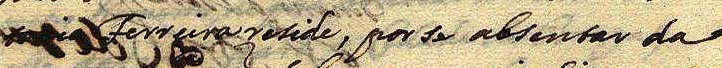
tonia Ferreira reside, por se absentar da
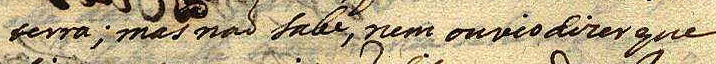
terra; mas naõ sabe, nem ouvio dizer que
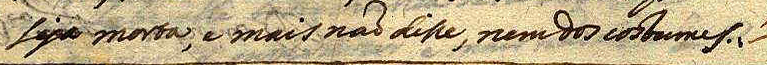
seja morta, e mais naõ disse, nem dos costumes.
